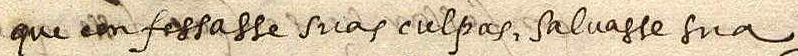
que confessasse suas culpas, saluasse sua
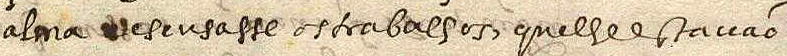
alma _ escusasse os trabalhos, que lhe estauaõ
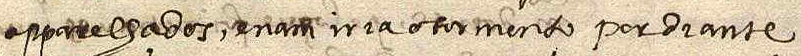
apparelhados, e nam iria o tormento por diante
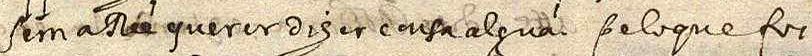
sem a Reé querer dizer cousa alguā. pelo que foi
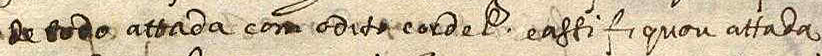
de todo attada com o dito cordel. e assi fiquou attada
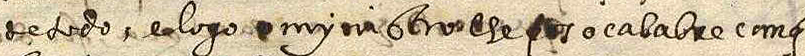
de todo, e logo o mynistro lhe pos o calabre com q̄
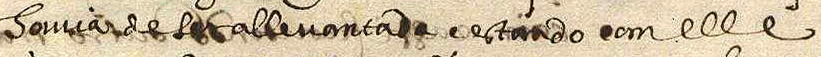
hauia de ser alleuantada e estando com elle
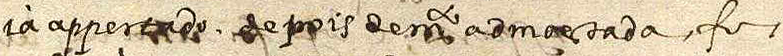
ia appertado, depois de mto admoestada, foi
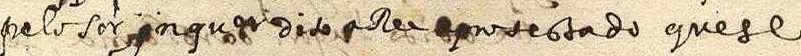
pelo sor̄ jnquor dito a Ree _ protestado que se
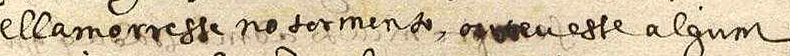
ella morresse no tormento, ou teuesse algum
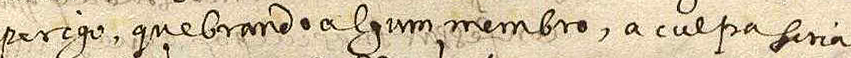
perigo, quebrando algum membro, a culpa seria
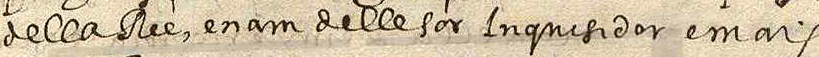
della Reé, e nam delle sōr Inquisidor e mais
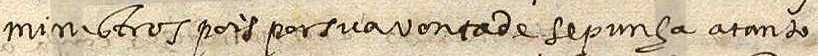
ministros pois por sua vontade se punha a tanto
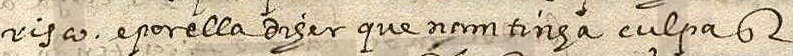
risco. e por ella dizer que nam tinha culpas
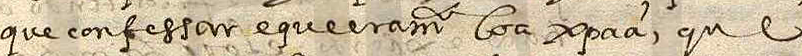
que confessar e que era mto boa xpaã, que
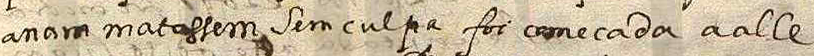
a nam matassem sem culpa foi começada a alle
